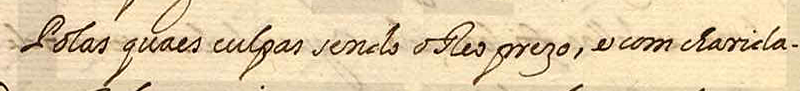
Polas quaes culpas sendo o Reo prezo, e com charida
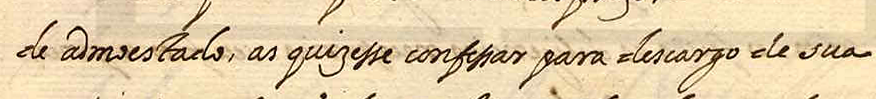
de admoestado, as quizesse confessar para descargo de sua
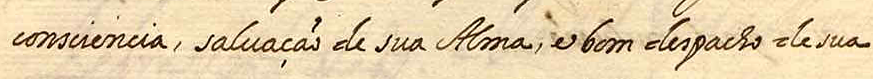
consciencia, saluaçaõ de sua Alma, e bom despacho de sua
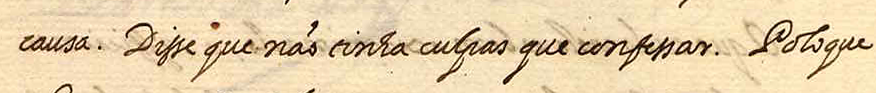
causa. Disse que naõ tinha culpas que confessar. Polo que
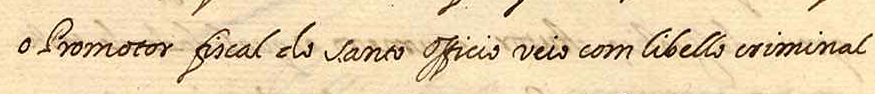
o Promotor fiscal do santo officio veio com libello criminal
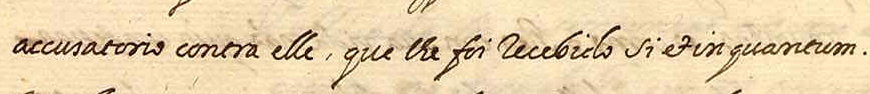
accusatorio contra elle, que lhe foi Recebido si et in quantum.
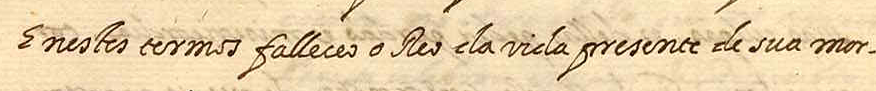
E nestes termos falleceo o Reo da vida presente de sua mor
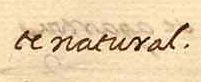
te natural.
